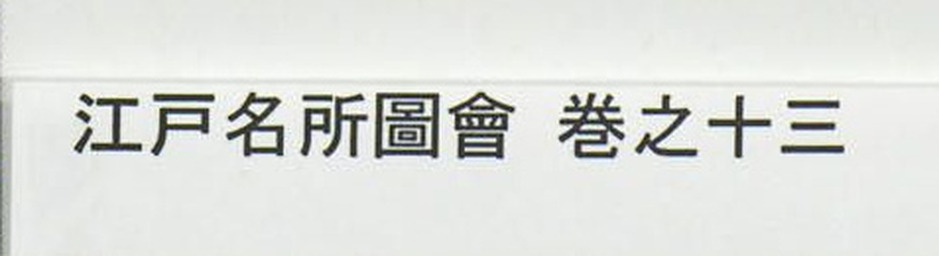江戸名所図會十三

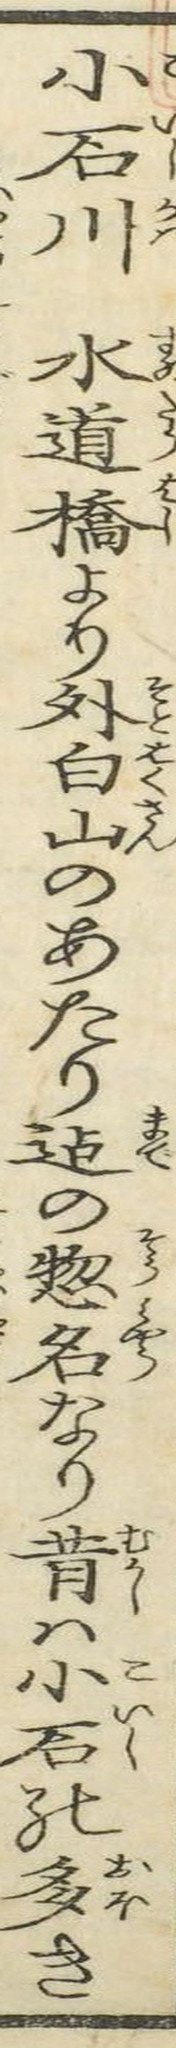小石川水道橋より外白山のあたり迄の惣名なり昔は小石の多き
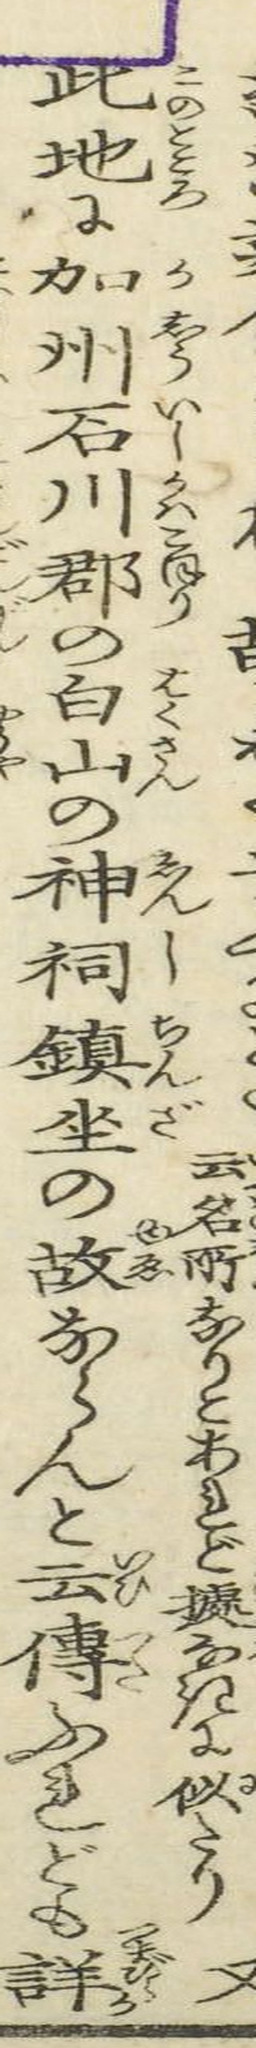此地に加州石川郡の白山の神祠鎮坐の故ならんと云伝ふれども詳
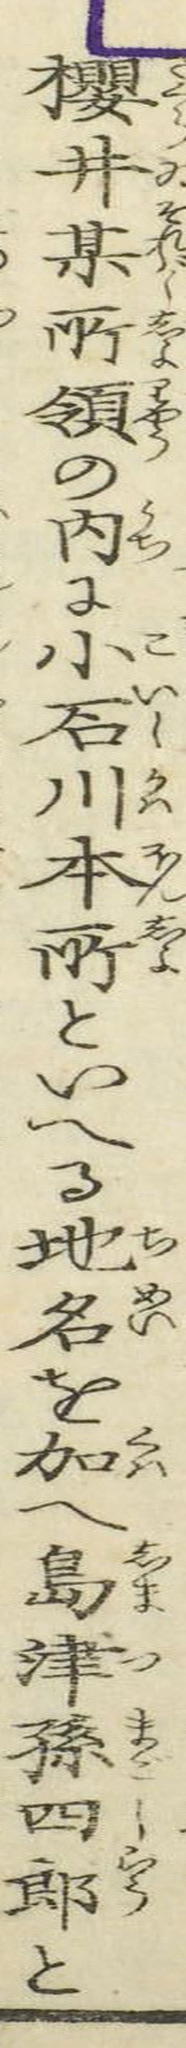桜井某所領の内に小石川本所といへる地名を加へ島津孫四郎と
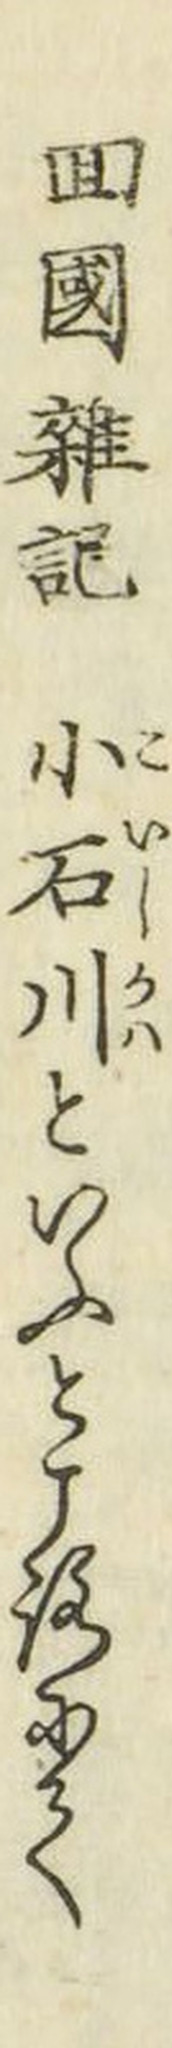回国雑記小石川といふところにて
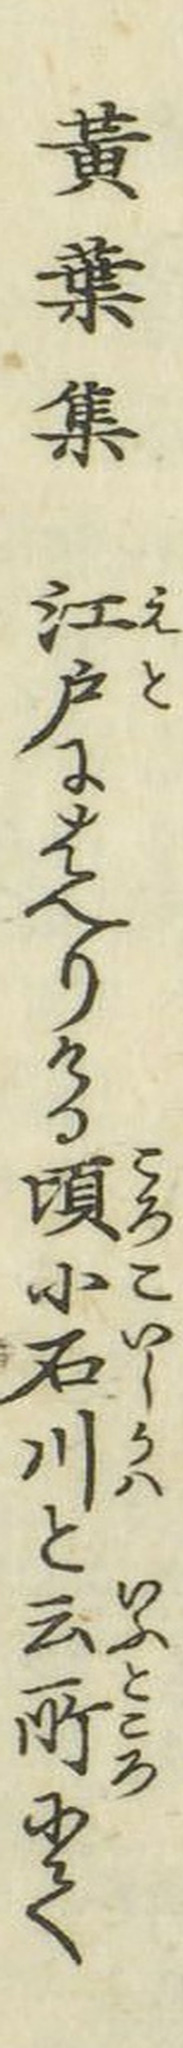黄葉集江戸にはへりける頃小石川と云所にて
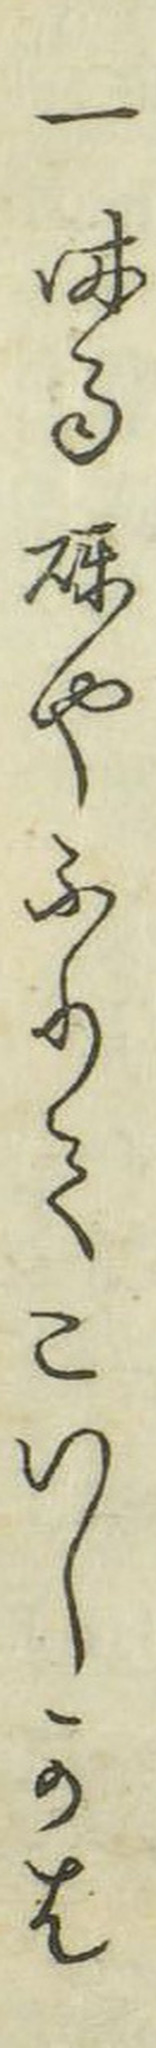一時雨礫やふりてこいしかは芭蕉
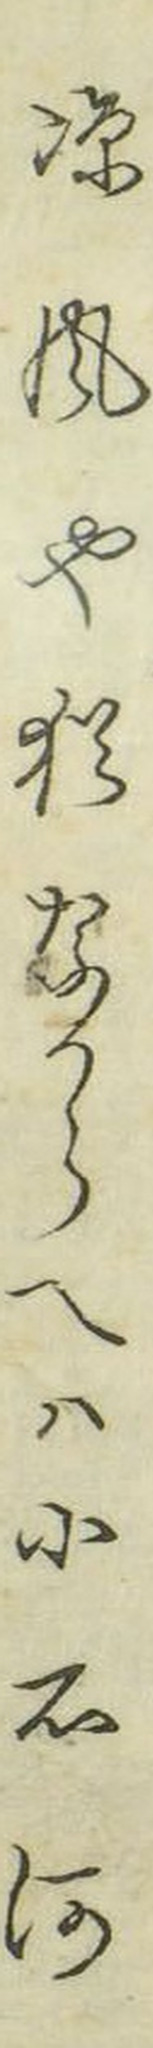涼風や猶なからへは小石河宗因

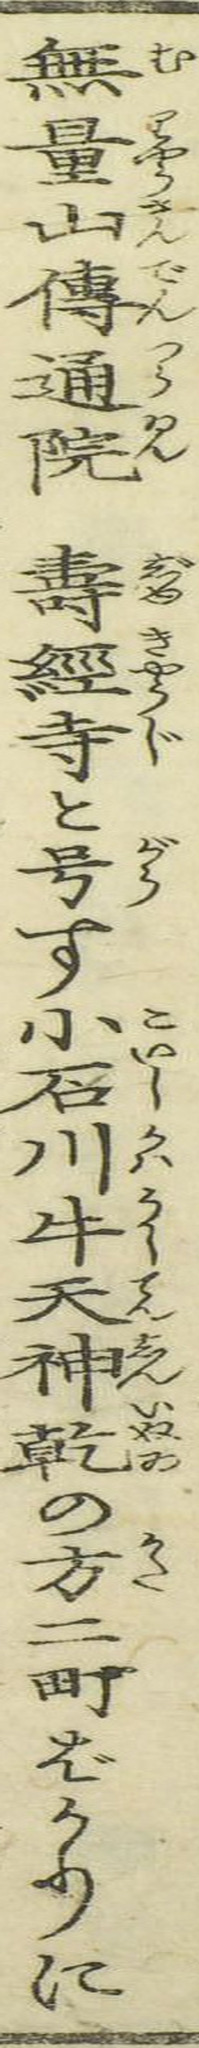無量山伝通院寿経寺と号す小石川牛天神乾の方二町ばかりに
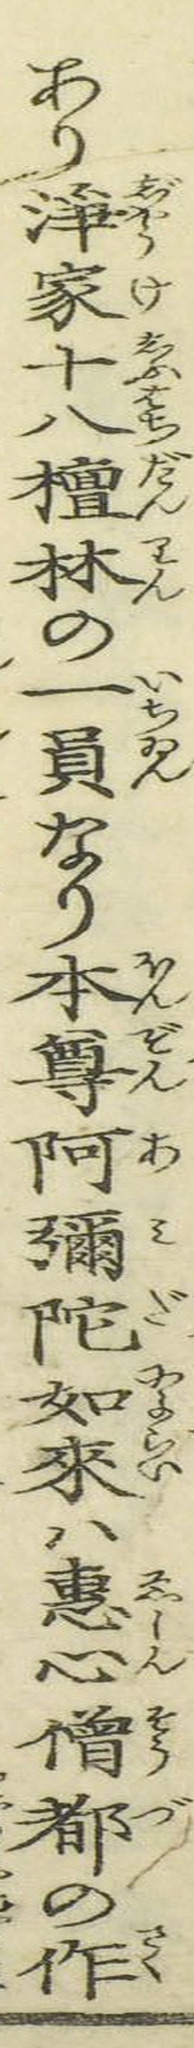あり浄家十八檀林の一員なり本尊阿弥陀如来は恵心僧都の作
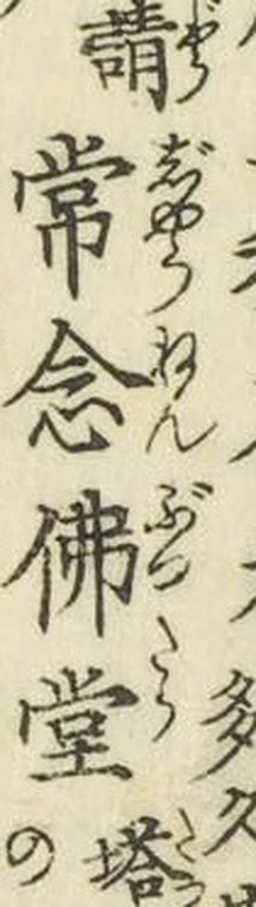常念仏堂
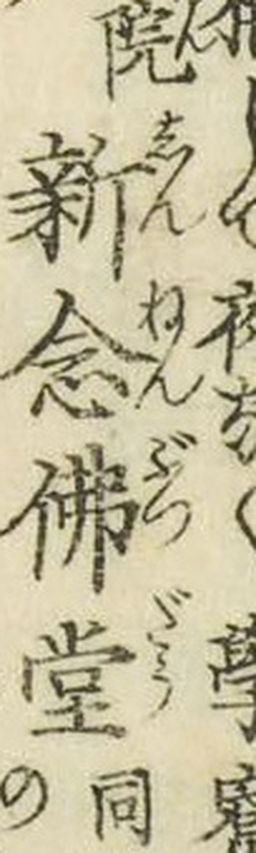常念仏堂

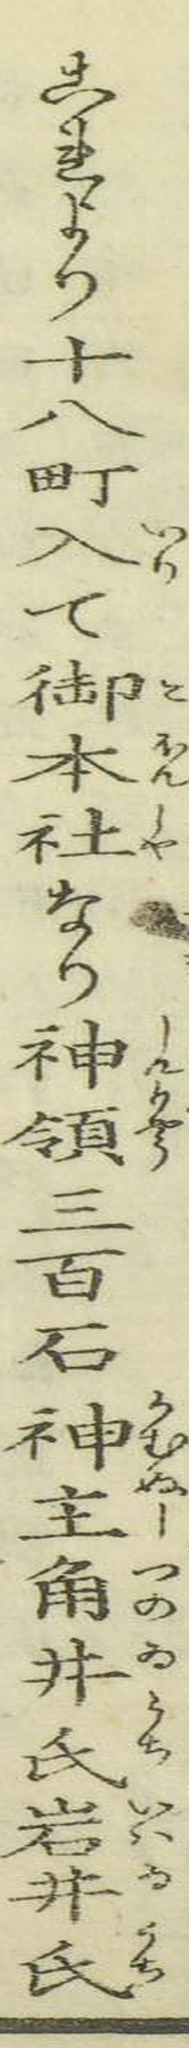これより十八町入て御本社なり神領三百石神主角井氏岩井氏
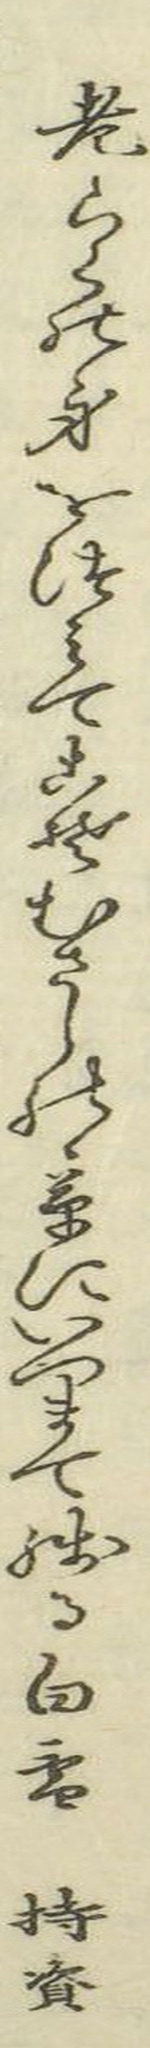老らくの身をつみてこそむさしのゝ草にいつまて残る白雪持資
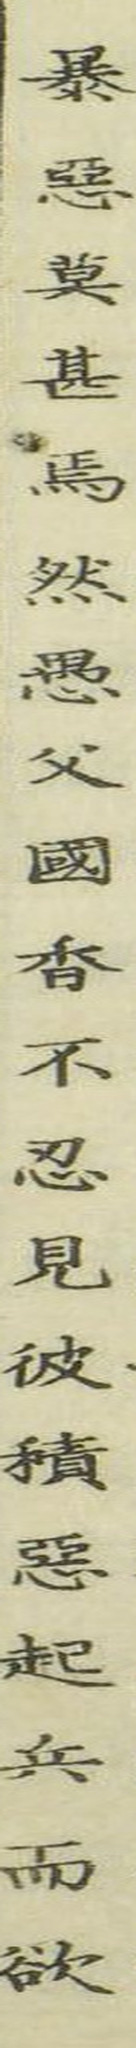暴悪莫甚焉然愚父国香不忍見彼積悪起兵而欲
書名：江戸名所図会 20巻 巻之13
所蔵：東京学芸大学教育コンテンツアーカイブ
